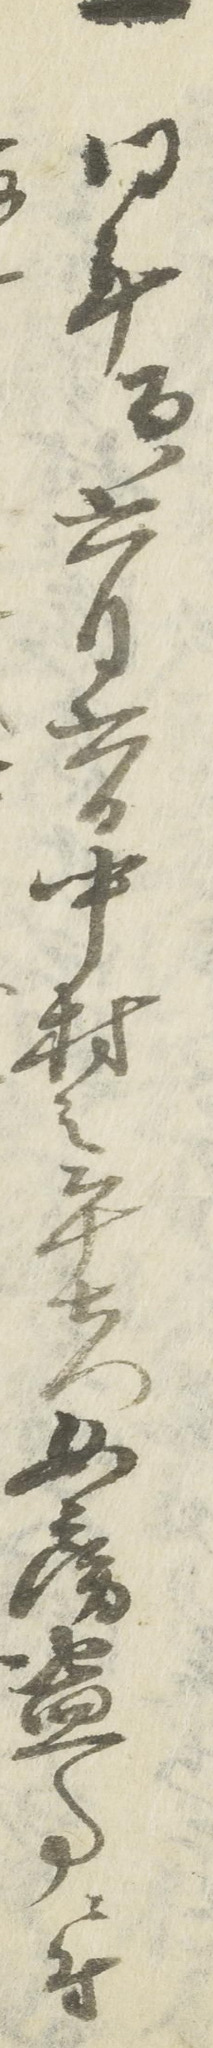一同年酉六月六日中村之平右衛門女房盗事ニ付
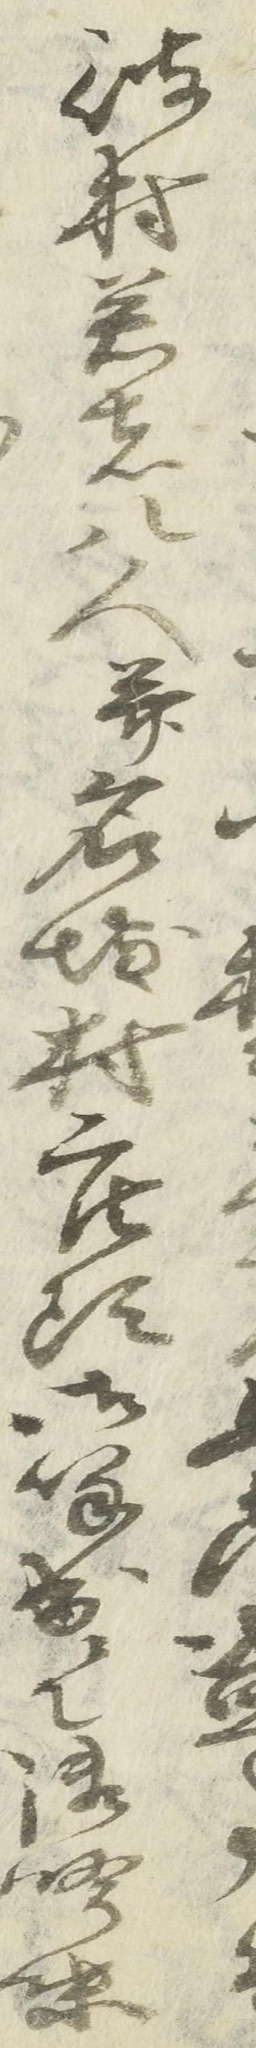彼村若者八人幷名塩村座頭御呼出ニて御吟味
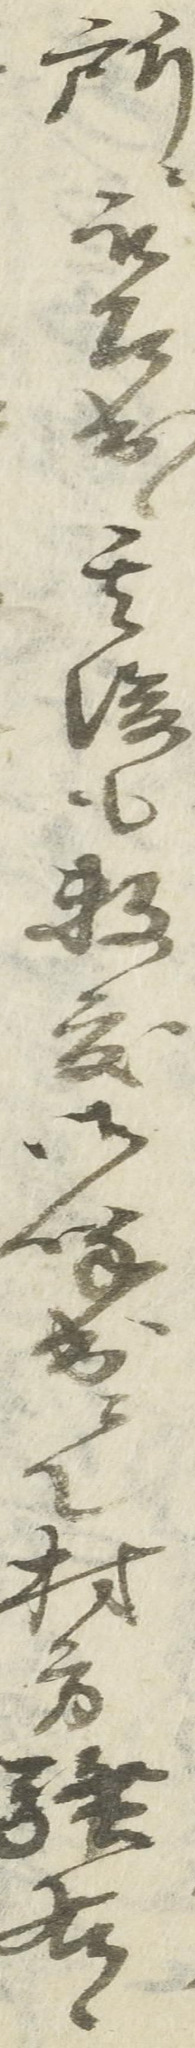所ニ被召出候其後も数度御呼出ニて村方騒居候
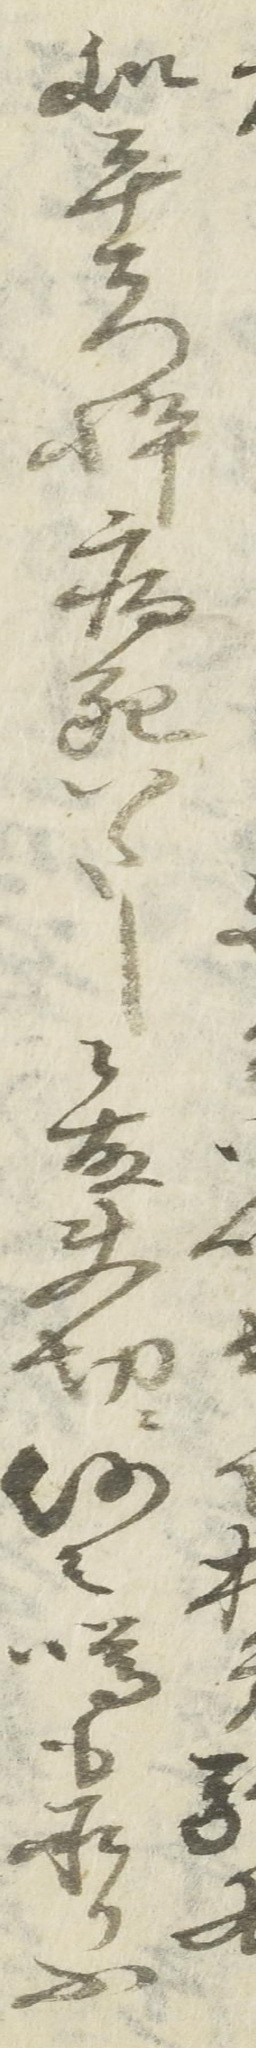処平右衛門忰病死いたし候故夫切ニ何之噂も承り不
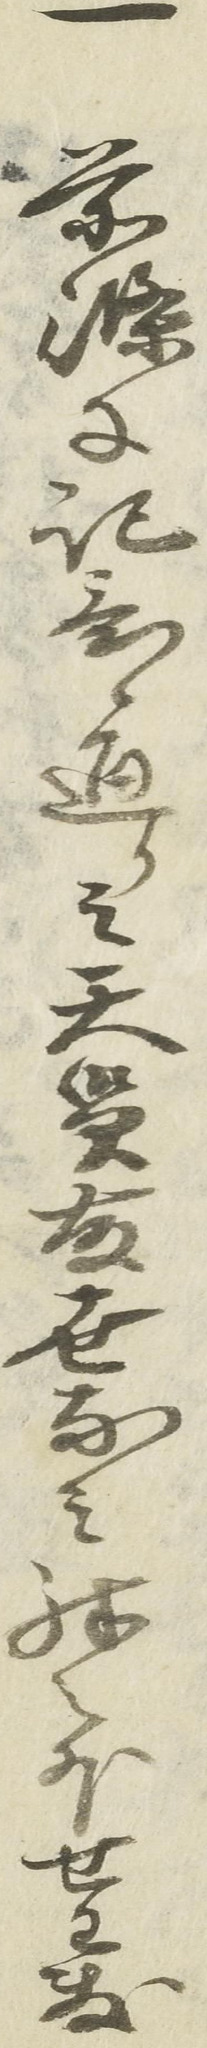一前条に記置候通り之天災故世なみ殊之外せわ敷
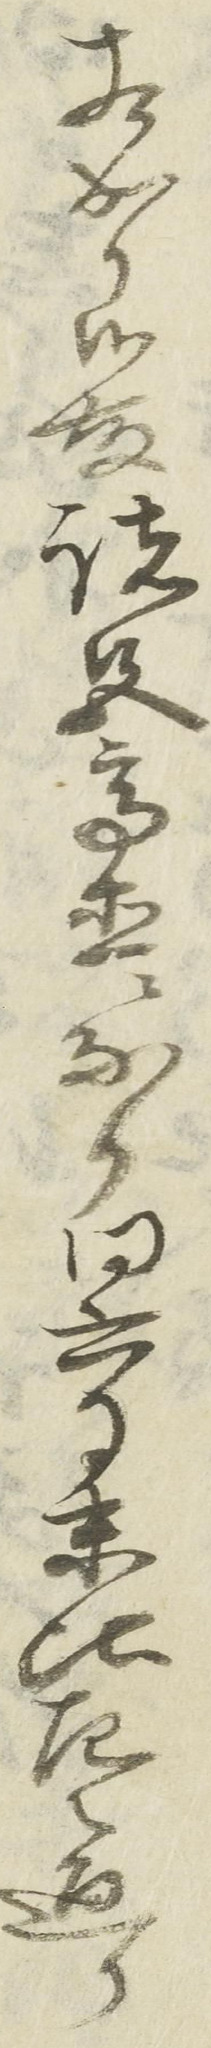相成り候故諸色高直ニなり同六月末比左之通り
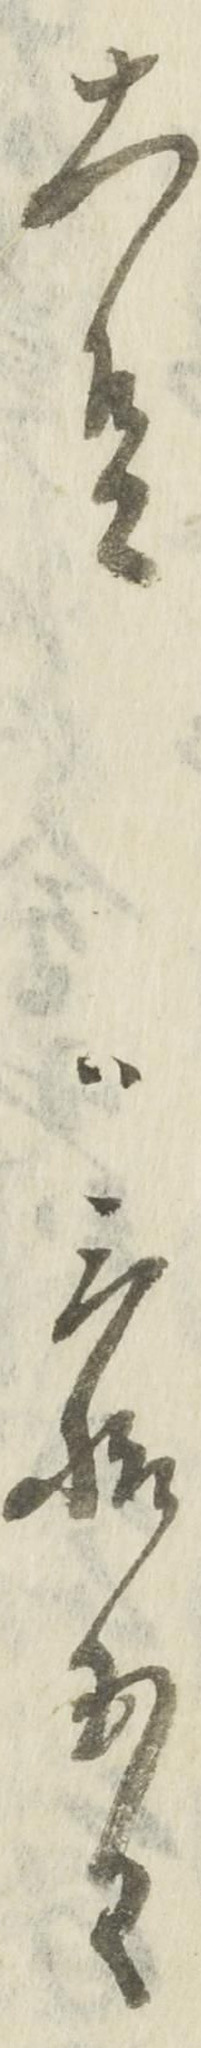大豆〃三拾五匁
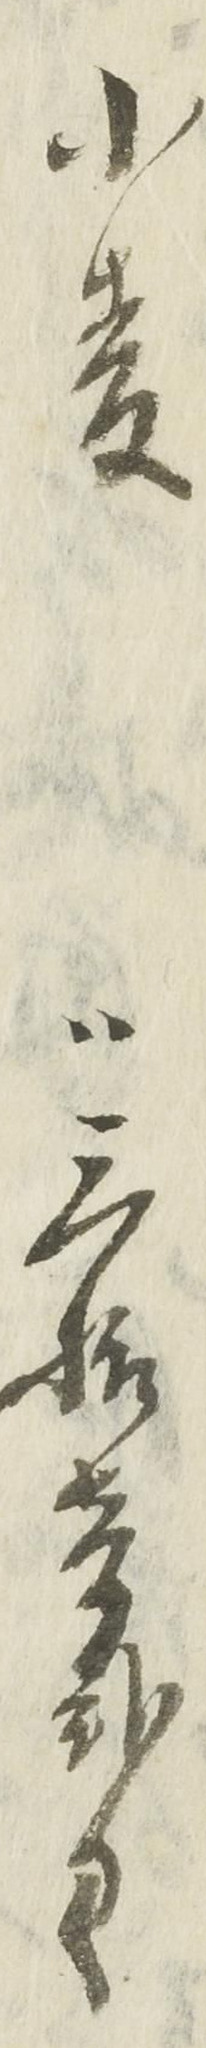小麦〃三拾壱弐匁
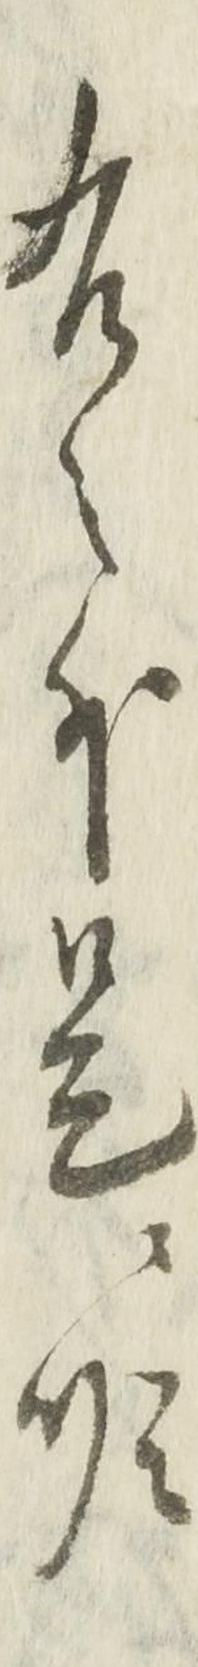右之外是ニ順
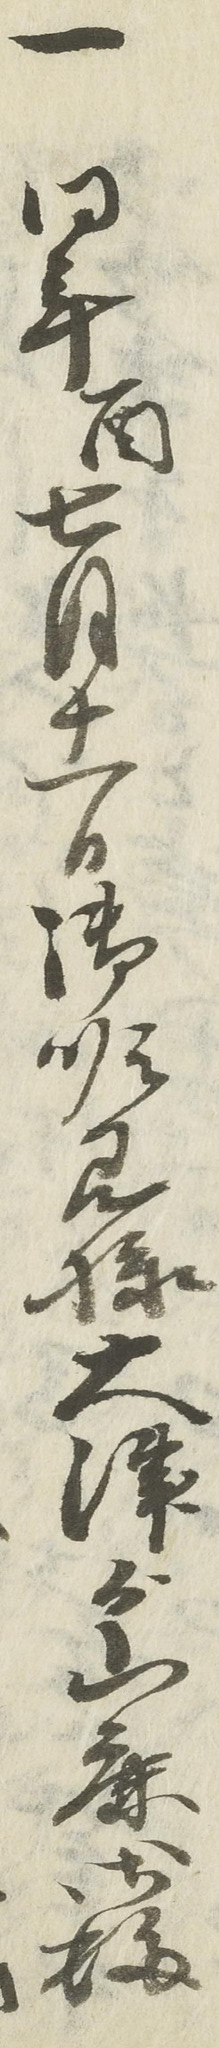一同年酉七月十一日御順見様大津ゟ山鹿へ御移
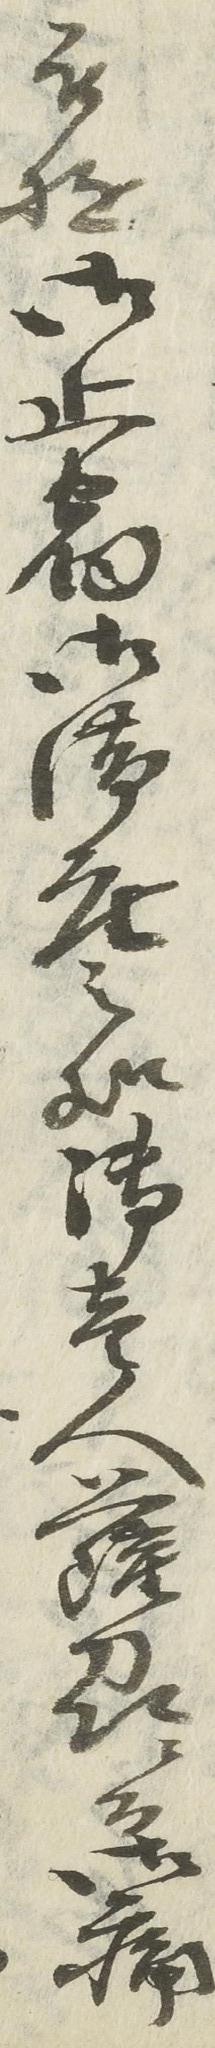被遊御止宿御滞座之処御壱人薩州ニて御痛
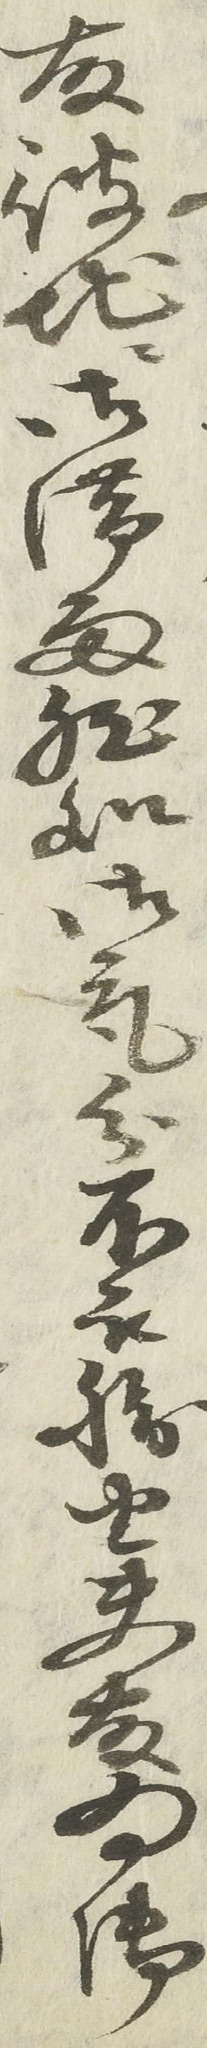故彼地ニ御滞留然処御気分不被勝由夫故為御
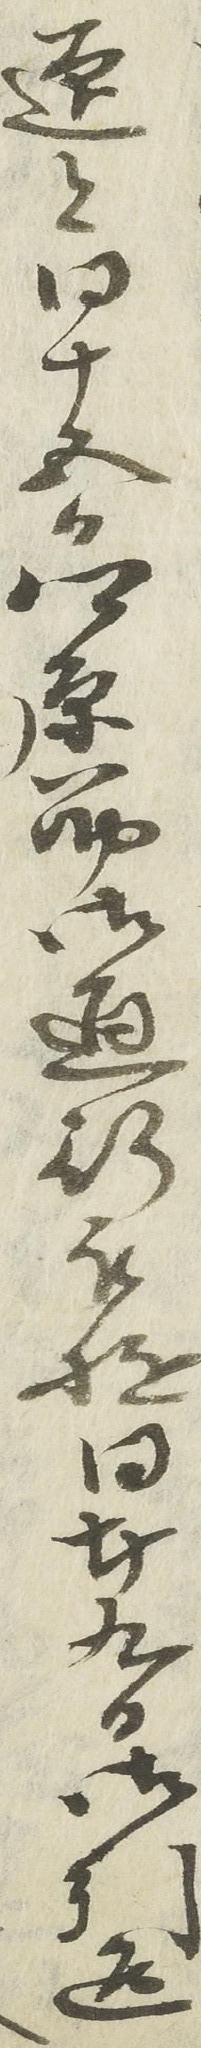迎と同十五日郷原筋御通行被遊同廿九日御引返
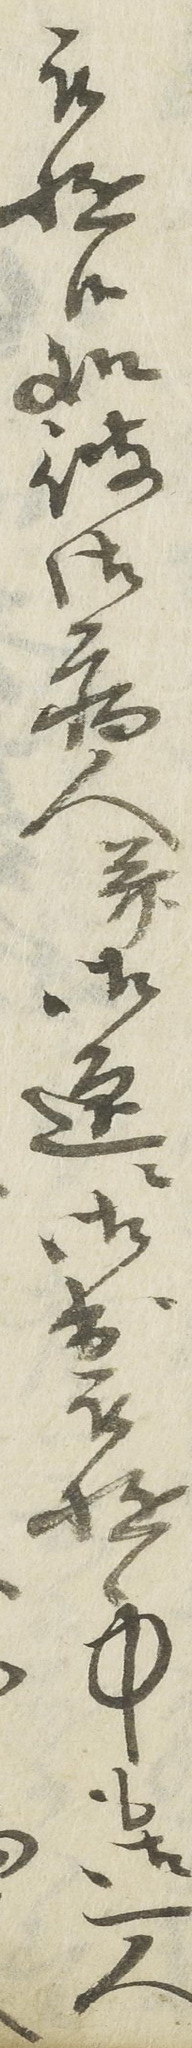被遊候処彼御病人幷御迎ニ御出被遊候中も御一人
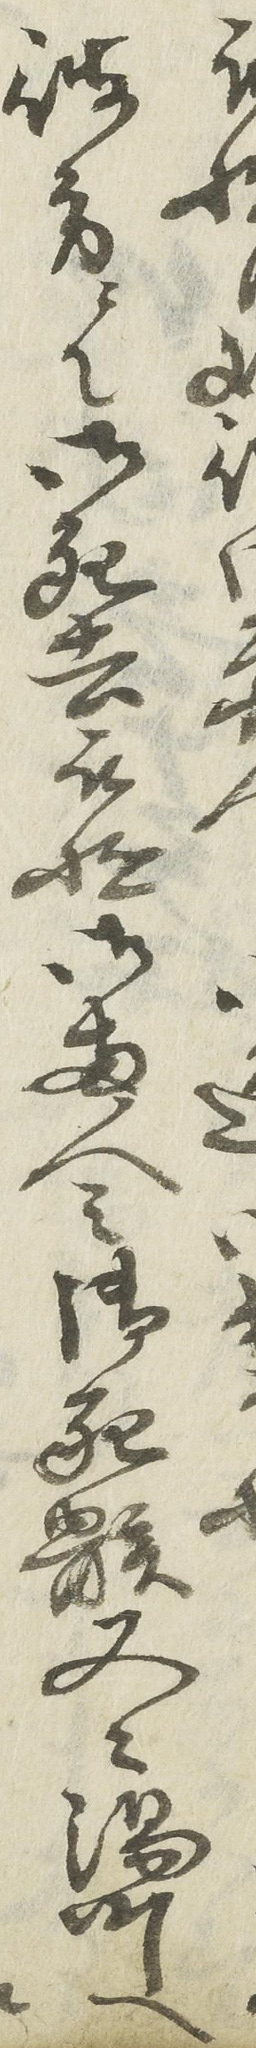彼方ニて御死去被遊御両人之御死骸又〻湯川へ
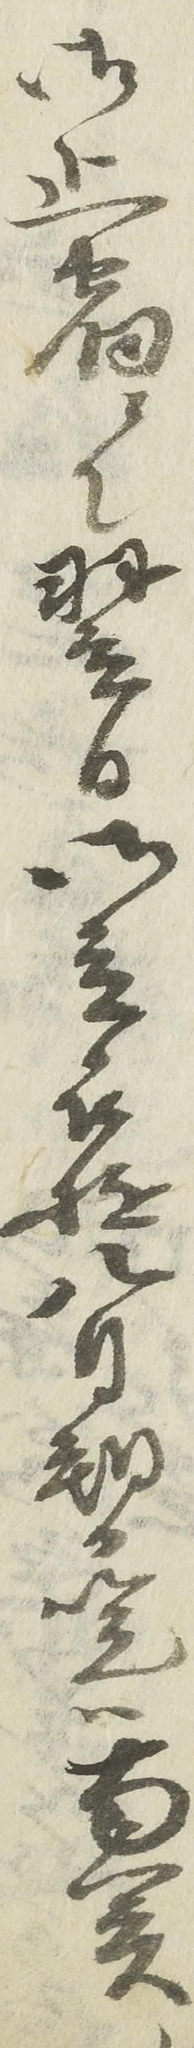御止宿ニて翌日御立被遊八月朔日晩は南関江
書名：後見笑
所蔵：東京大学地震研究所図書室 Earthquake Research Institute Library, The University of Tokyo, JAPAN
